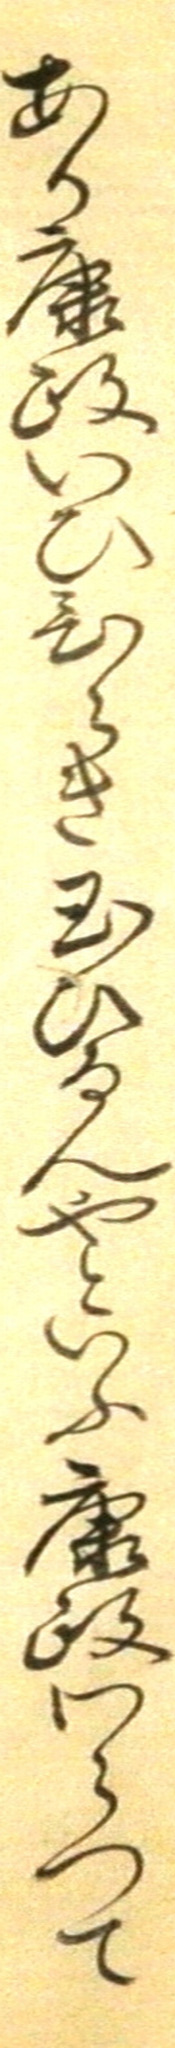あり康政いひひらき玉ひなんやといふ康政わらつて
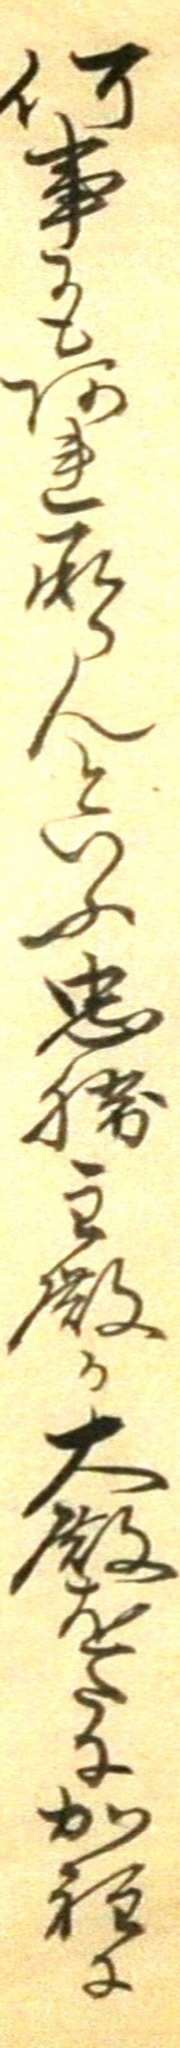何事にもあれ承らんといふ忠勝主殿か大殿をたにか程に
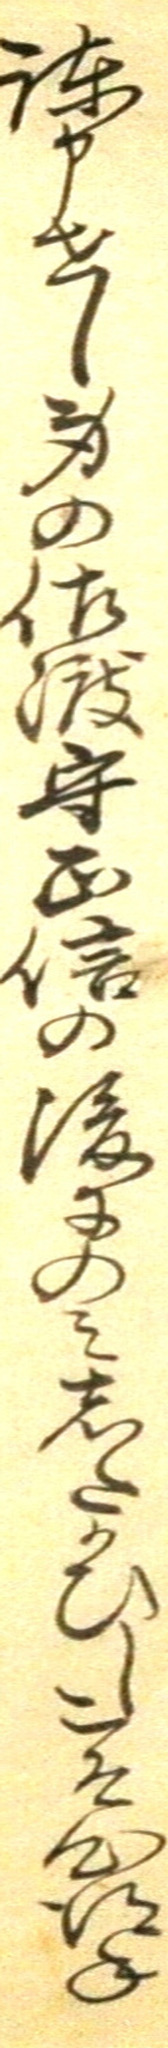諫申せし身の佐渡守正信の後にのみしたかひしこそ心得ね
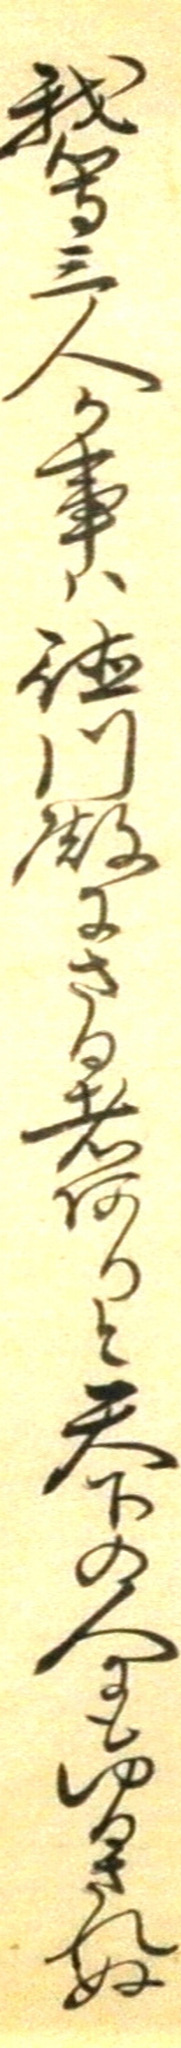我等三人か事は徳川殿にさる者ありと天下の人にもゆるされぬ
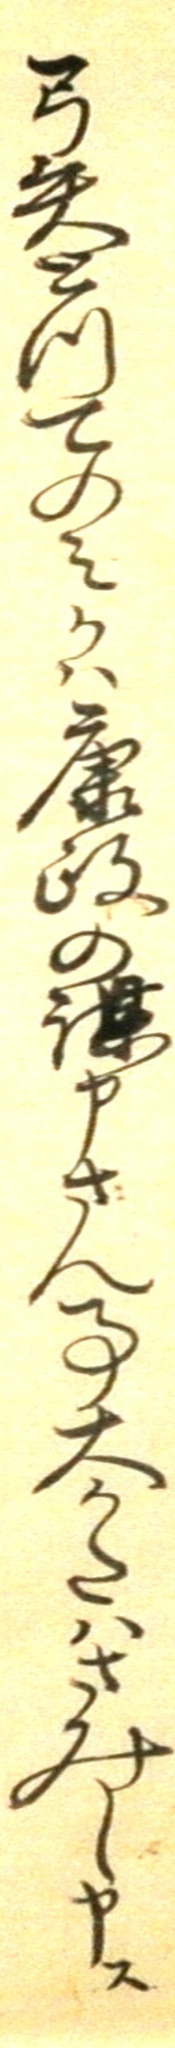弓矢とつてのみかは康政の謀申さん事大かたはさみし申ス
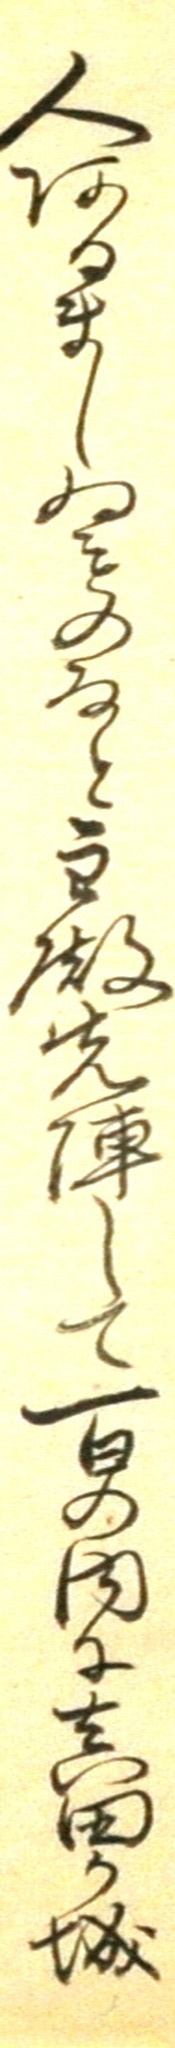人あるましゐものなと主殿先陣して一日の内に真田か城
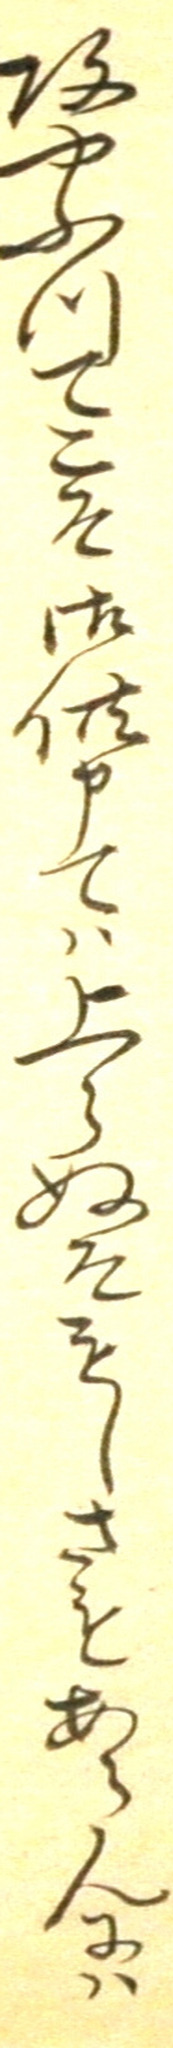攻やふつてこそ御供申ては上らぬそもしさもあらんには
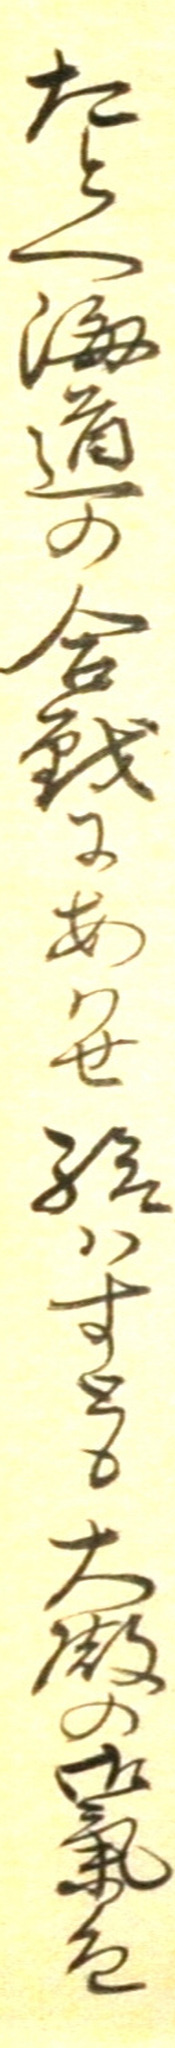たとへ海道の合戦にあわせ給はすとも大殿の御気色
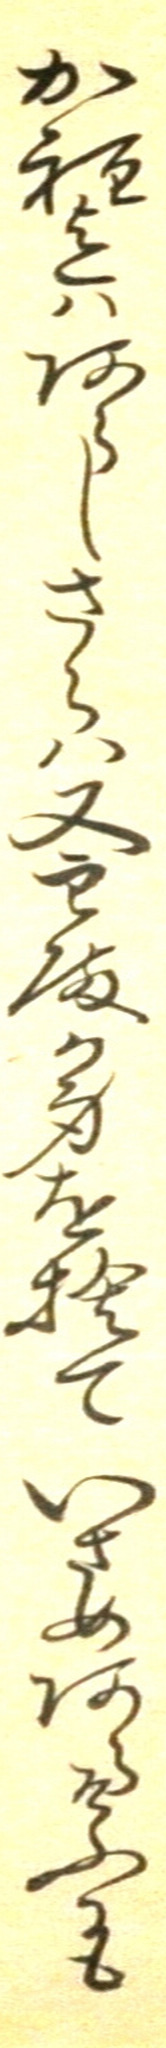か程迄はあらしさらは又主殿か身を捨ていさめあらそふにも
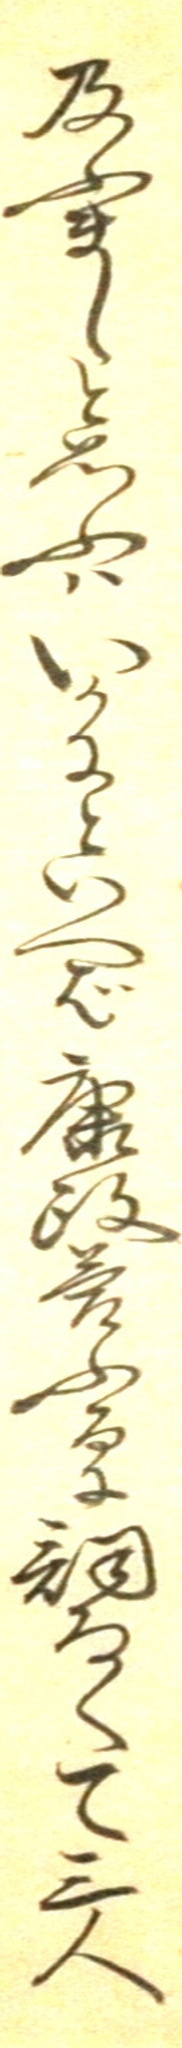及ふましと思ふはいかにといへば康政答ふるに詞なくて三人
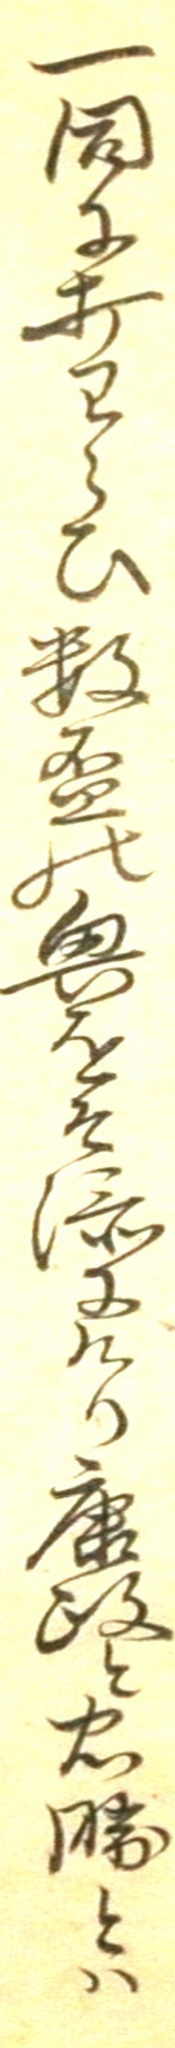一同に打わらひ数盃の興をそ添にけり康政と忠勝とは
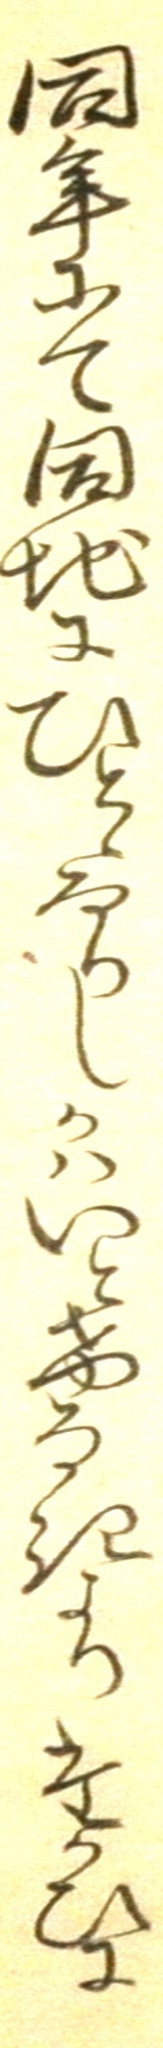同年にて同地にひとゝなりしかはいとけなきよりたかひに
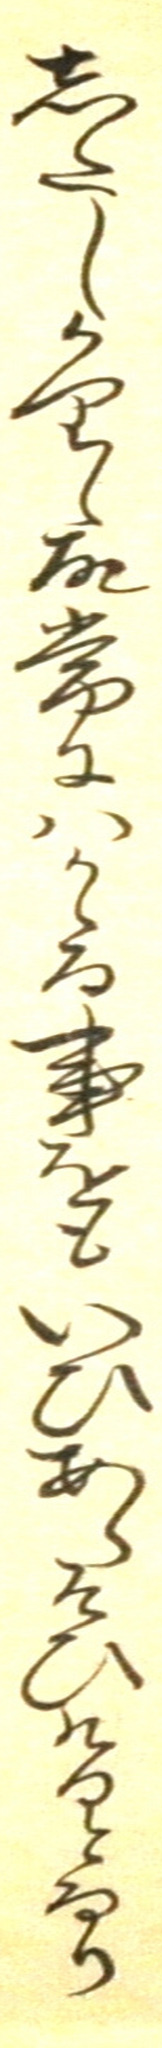したしかりし故常にはかるゝ事をもいひあらそひけるとなり
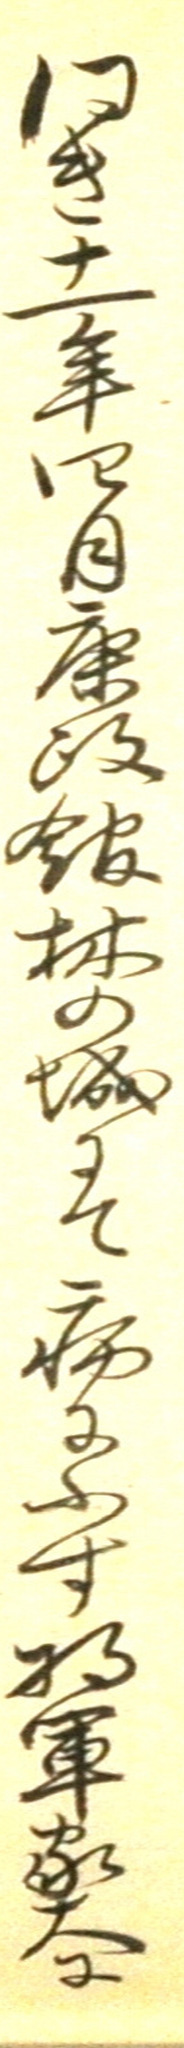同き十一年四月康政館林の城にて病にふす将軍家大に
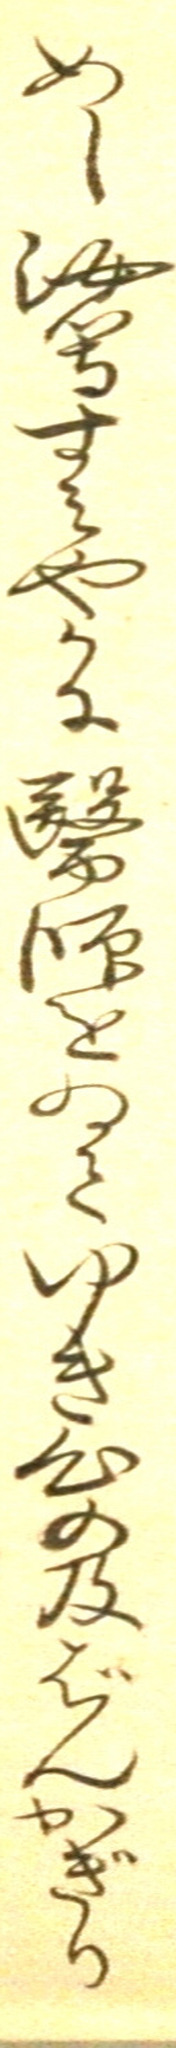めし汝等すみやかに医師を給てゆき心の及ばんかぎり
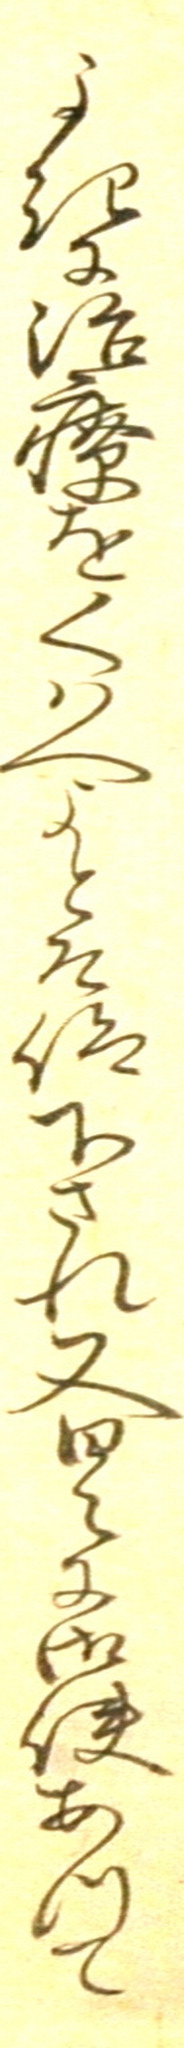よきに治療をくはへよとそ仰下され又日々に御使あつて
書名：藩翰譜（四・上）
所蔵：伊那市立高遠町図書館・合同会社AMANE
